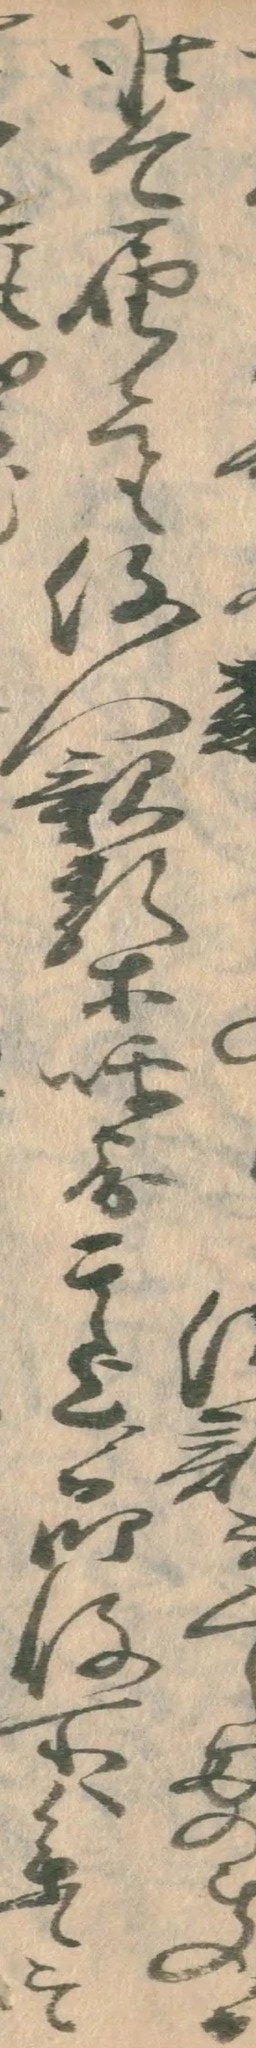唯今届候ても役人親類等呼寄其上ニ而御役所へ参候て
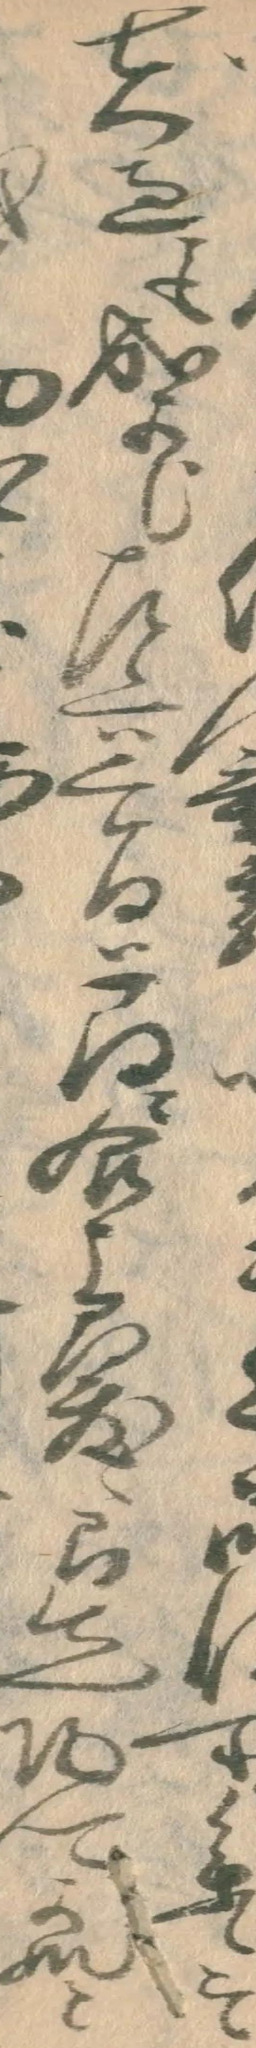七ツ過ニも成申候左候へハ今日ハ間ニ合申間敷候間先帰郷可然と
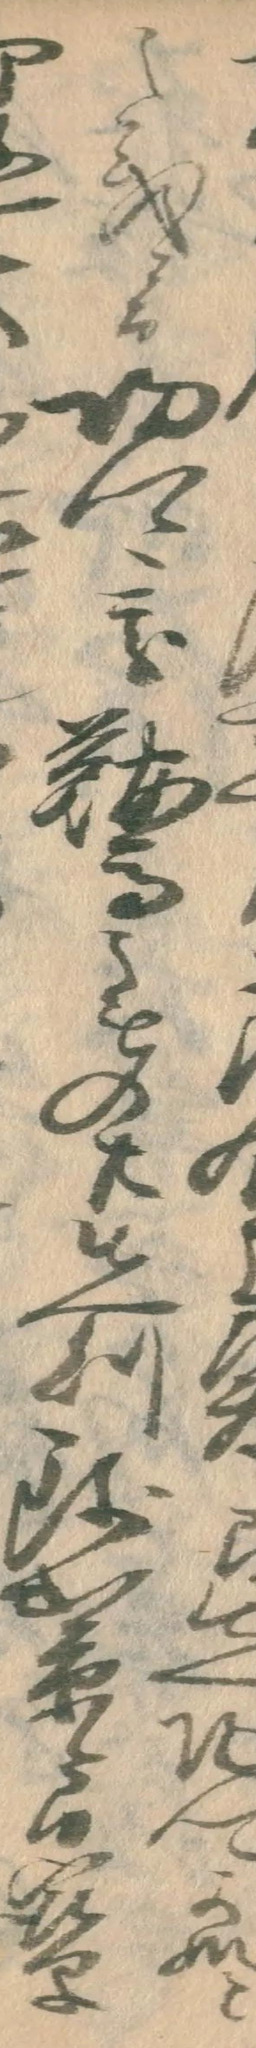之義ニ而帰郷候処鞍馬之もの共先刻致出京候間最早
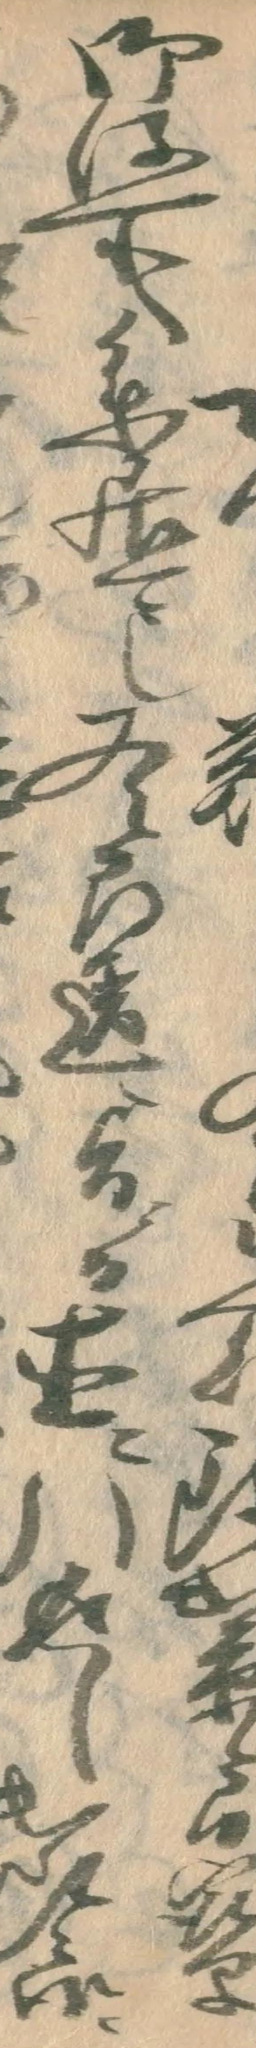御役所へ参居可申候又々間違候旨ニ而直ニ引返し出頭候様ニ
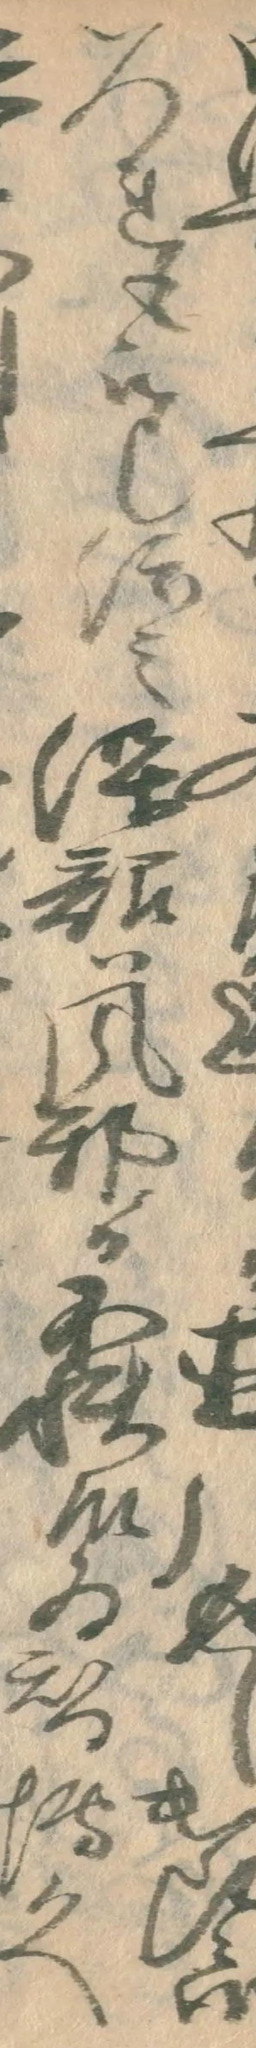いつれも被申候依之保韶ハ風邪ニ而不快故為替博久
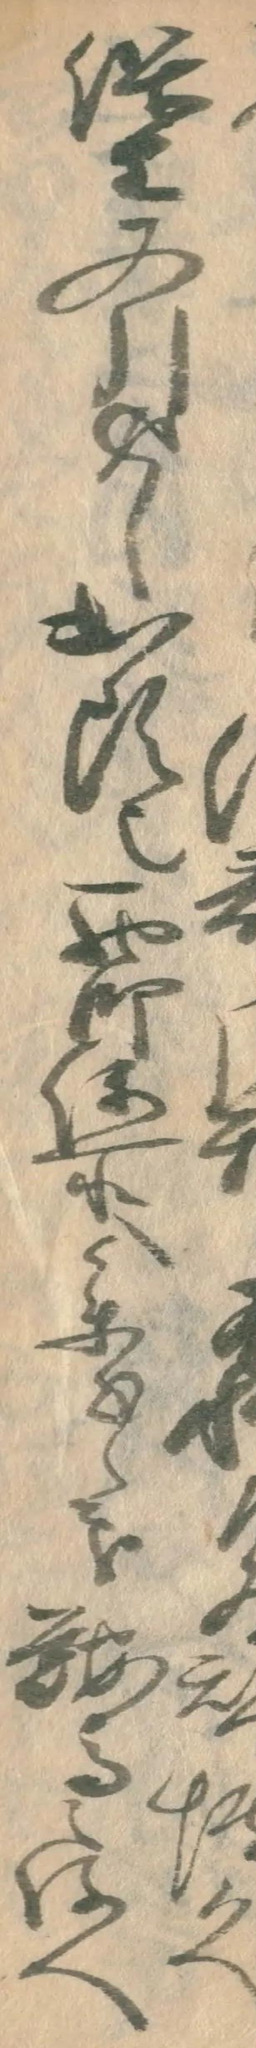保土又引返し出頭也西御役所へ参上之処鞍馬之役人

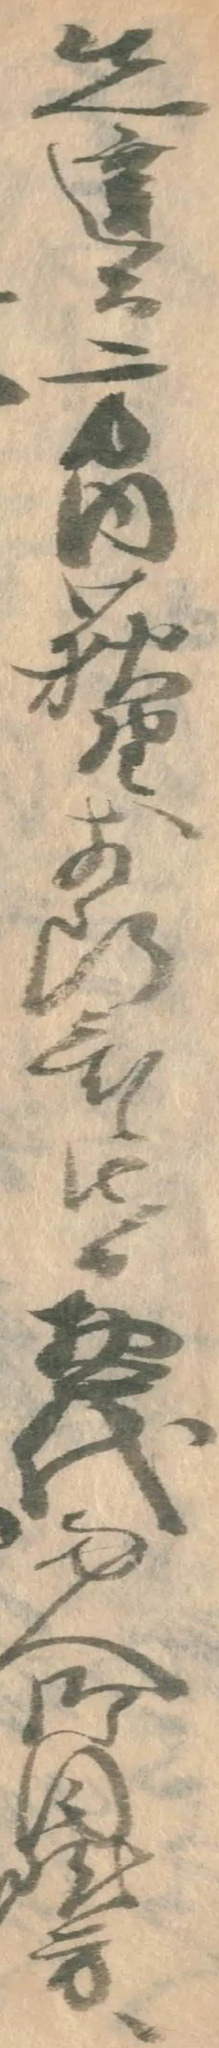先達而方内荻野へ相断置候由ニ而惣代両人御目付方へ
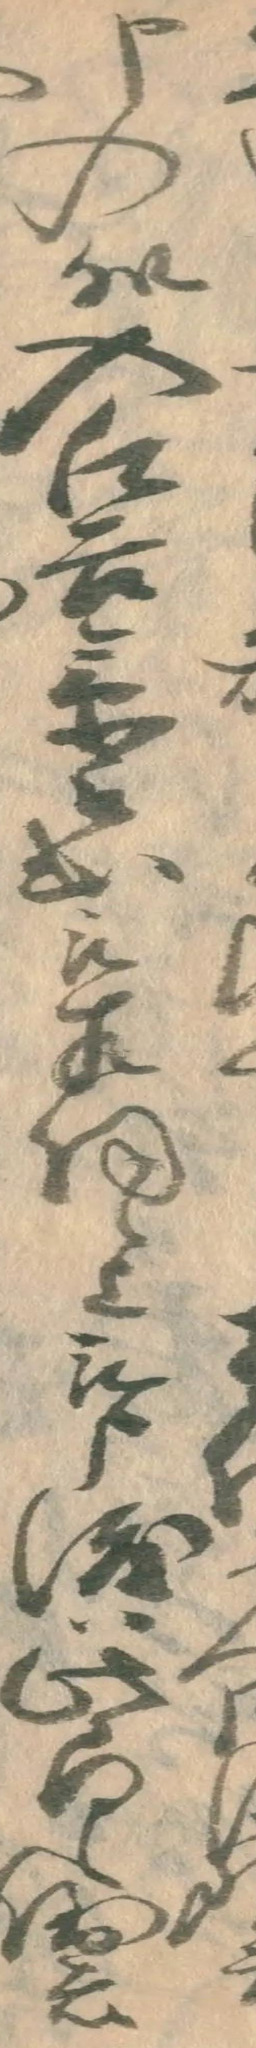申入処入江吉兵衛被出被相伺候上被申渡ハ此間之倒者
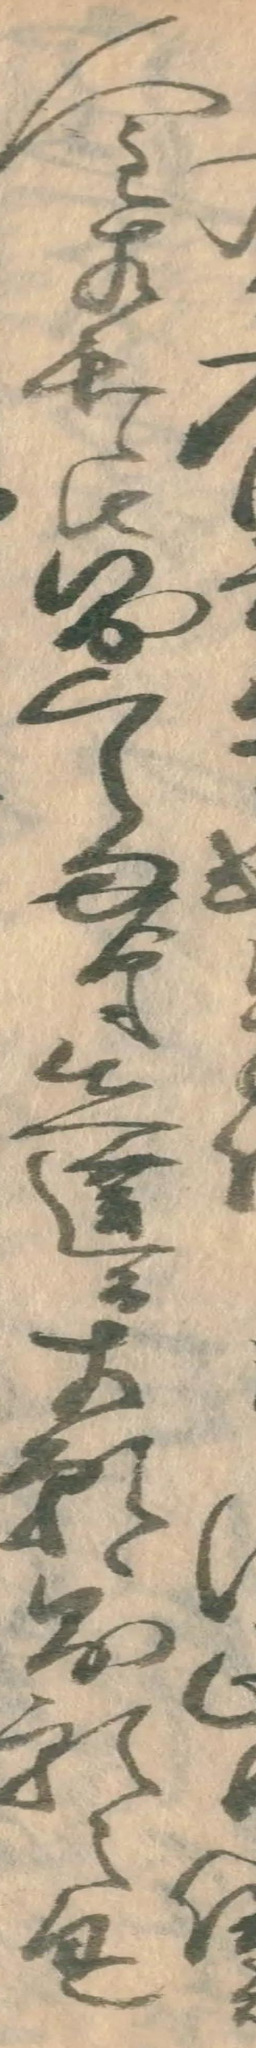人主相知候由則くらまゟも先達而相願候則願之通
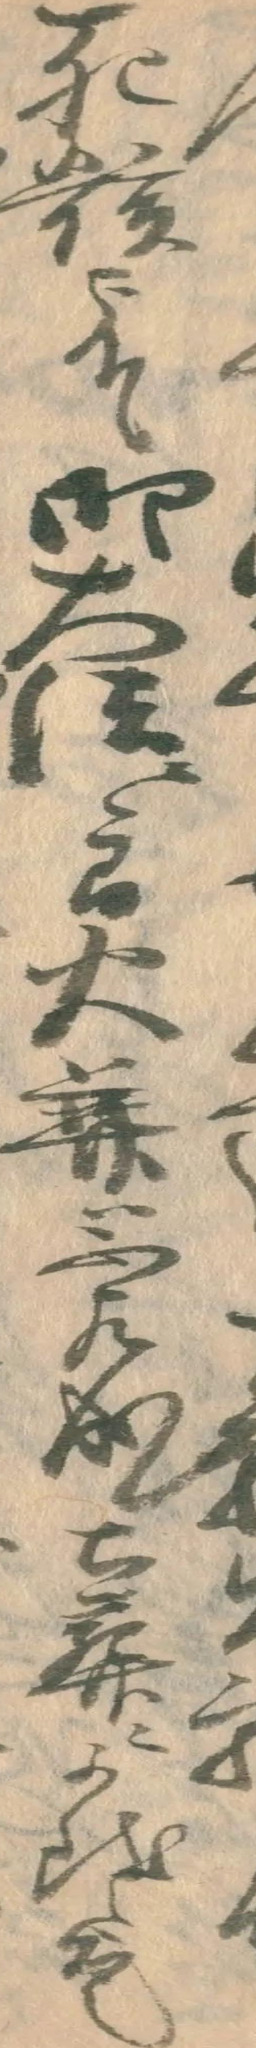死骸被下候御大法ニ候間火葬ハ不相成候土葬に可致候旨也
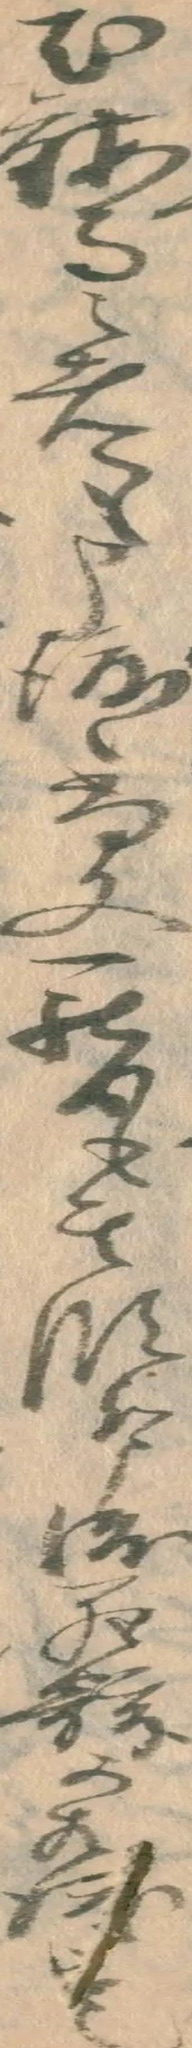尤鞍馬之者へも申渡候尚又一社ゟも其段被申渡死骸可相渡旨也
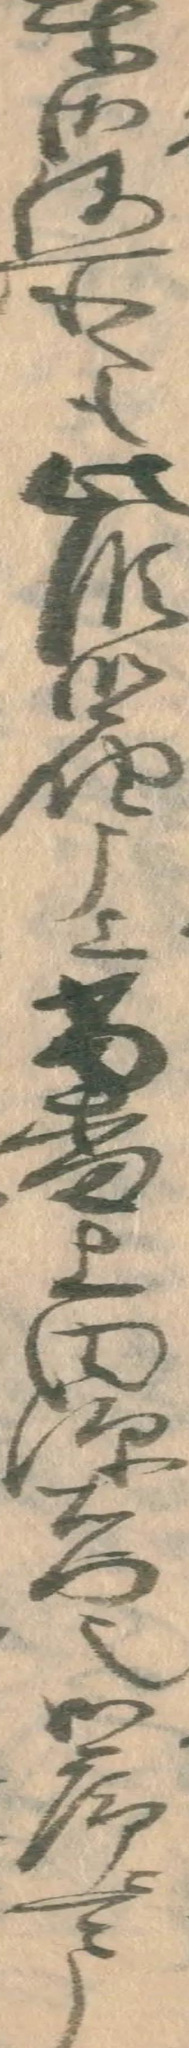東御役所へも此段御届申上当番上田源右衛門也御序ニ可申
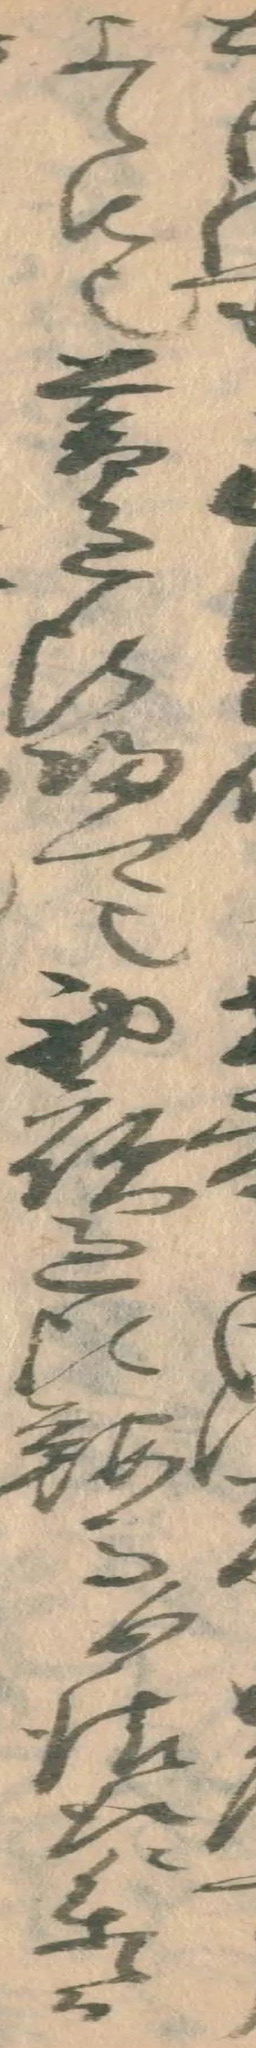上候由也暮過比帰郷也初夜過比鞍馬ゟ請取ニ参候而
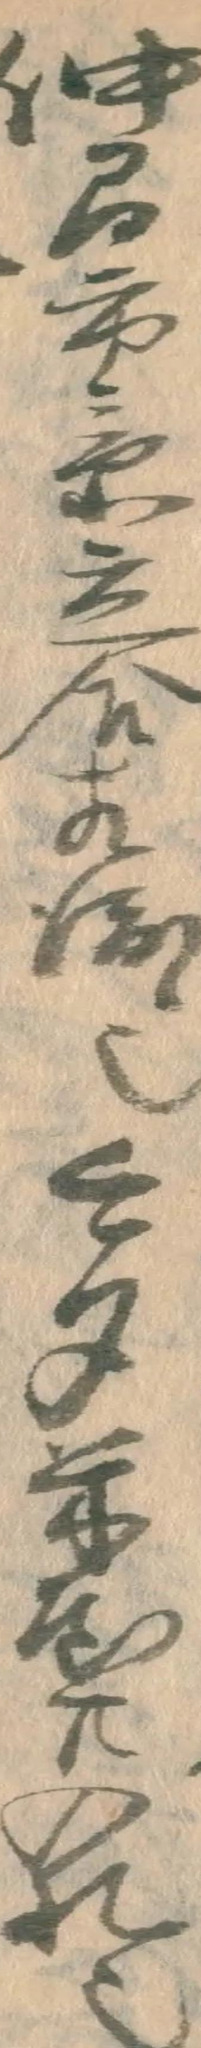仲間市兵衛立合相渡候也今夕米屋共入札也
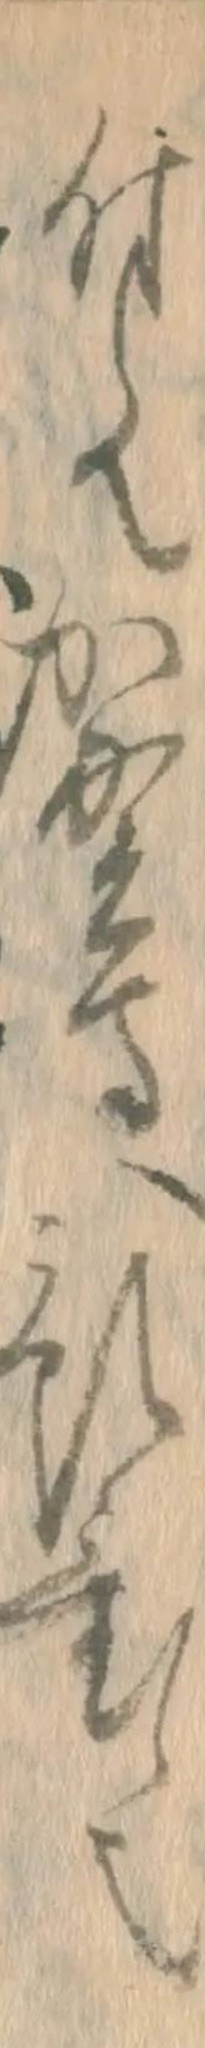付之加賀守へ預置候也
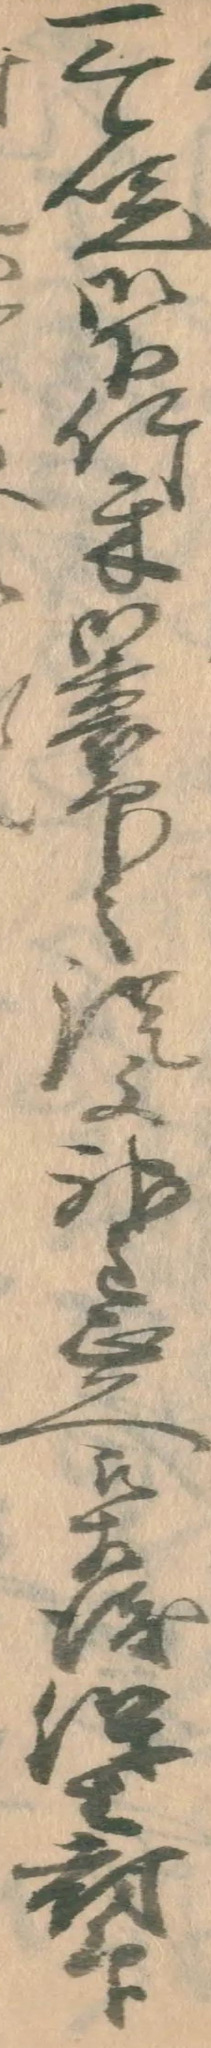一今晩御下行米御裏印之証文神主正久被相渡保土封印
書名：賀茂社記録. 第60冊
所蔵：国立国会図書館 National Diet Library, JAPAN
